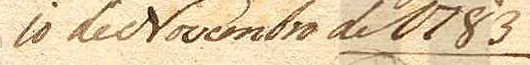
10 de Novembro de 1783
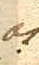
as
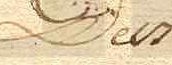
De v s.as
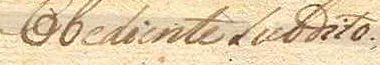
Obediente subdito
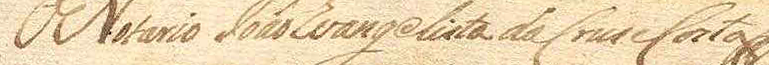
O Notario Ioão Evangelista da Crus e Costa
